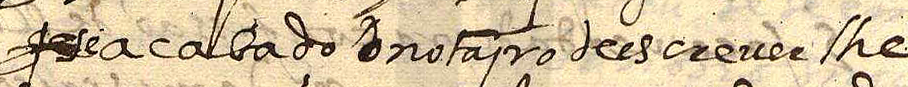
_ se acabado o notajro de escreuer lhe
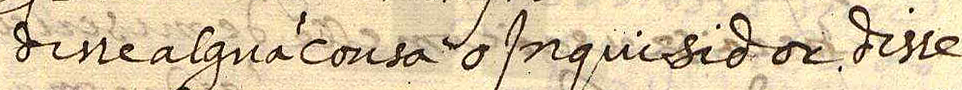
disse alguā cousa o Jnquisidor disse
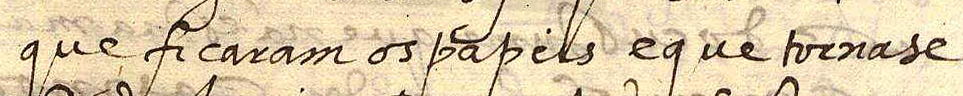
que ficaram os papeis e que tornase
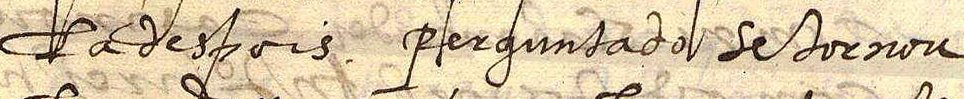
La despois. perguntado se tornou
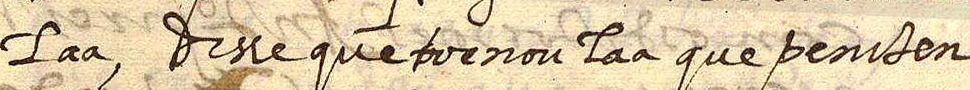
Laa, disse que tornou Laa que peniten
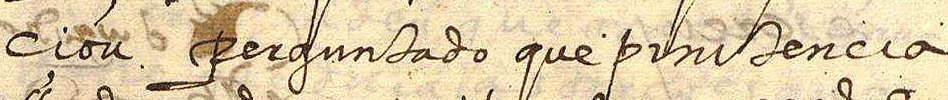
çiou. perguntado que pinitencia
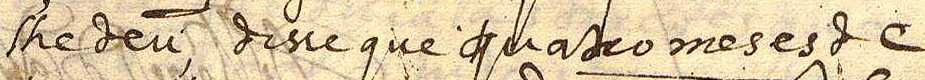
lhe deu, disse que quatro meses de
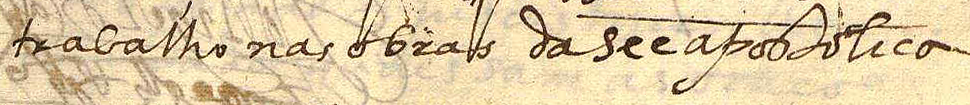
trabalho nas obras da see apostolica
